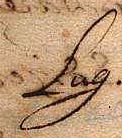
Lug.
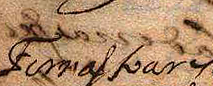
Fernaõ soares
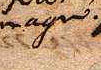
magro.
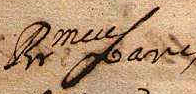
Brmeu Soares
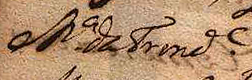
M.a da Trinde.
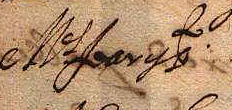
Mel Soares pto.
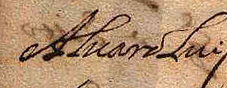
Aluaro Luiz
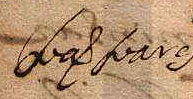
Joaõ Soares
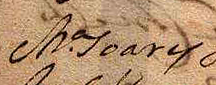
M.a Soares
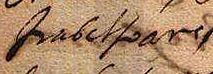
Jzabel Soares
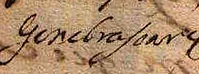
Genebra Soares
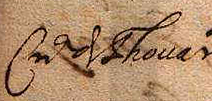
Cna d Thouar
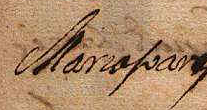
Maria Soares
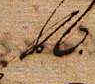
R.
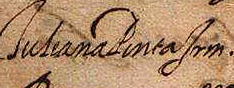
Juleana Pinta Jrm.
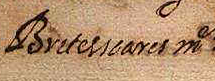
Brites soares me.r
